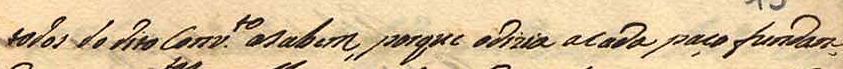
todos do dito conv.to o sabem, porque o dizia a cada paço fundan
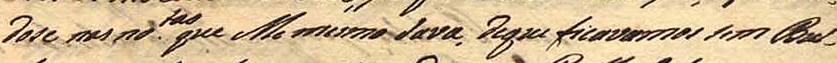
dose nas no.tas que elle mesmo dava, de que ficavamos sem Bul
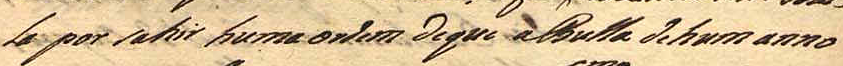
la por sahir huma ordem de que a Bulla de hum anno
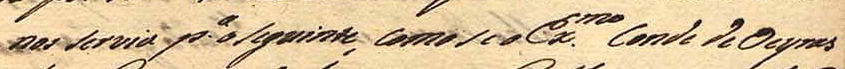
nos servia p.a o seguinte, como se o Ex.mo Conde de Oeyras
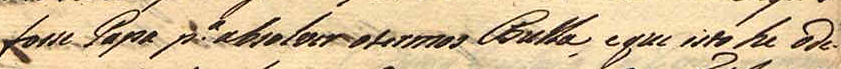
fosse Papa p.a absolver o termos Bulla, e que isto he o de
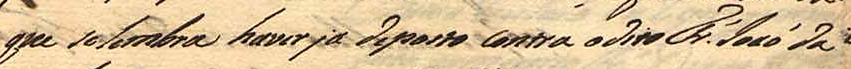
que se lembra haver ja deposto contra o dito Fr. Ioaõ da
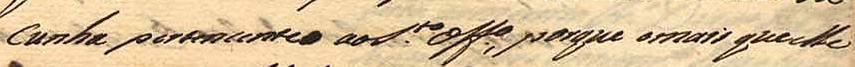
Cunha pertencente ao S.to Off.o, porque o mais que elle
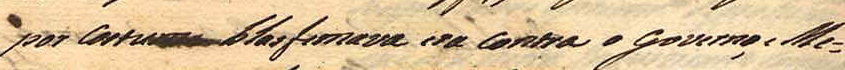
por costu_ blasfemava era contra o Governo, e Me
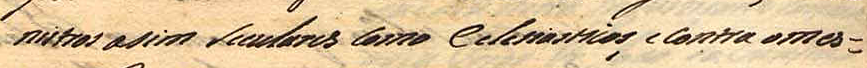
nistros asim seculares como Eclesiasticos, e contra o mes
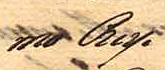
mo Rey.
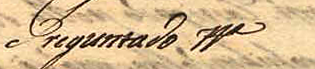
Preguntado tta
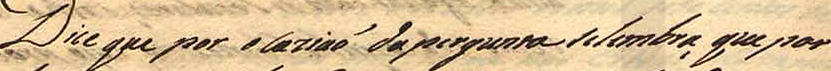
Dice que por ocaziaõ da pergunta se lembra, que por
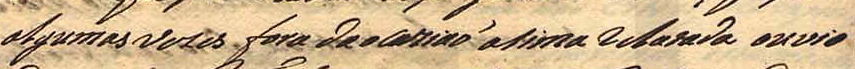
algumas vezes fora da ocaziaõ asima Relatada ouvio
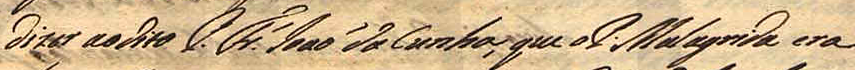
dizer ao dito P. Fr. Ioaõ da Cunha, que o P. Malagrida era
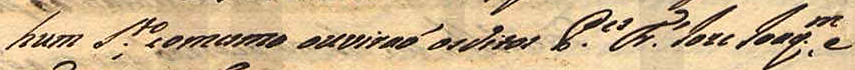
hum s;to e o mesmo ouviraõ os ditos P.es Fr. Ioze Ioaq.m e
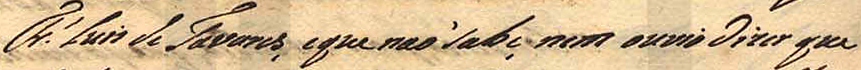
Fr. Luis de Tavares, e que naõ sabe, nem ouvio dizer que
